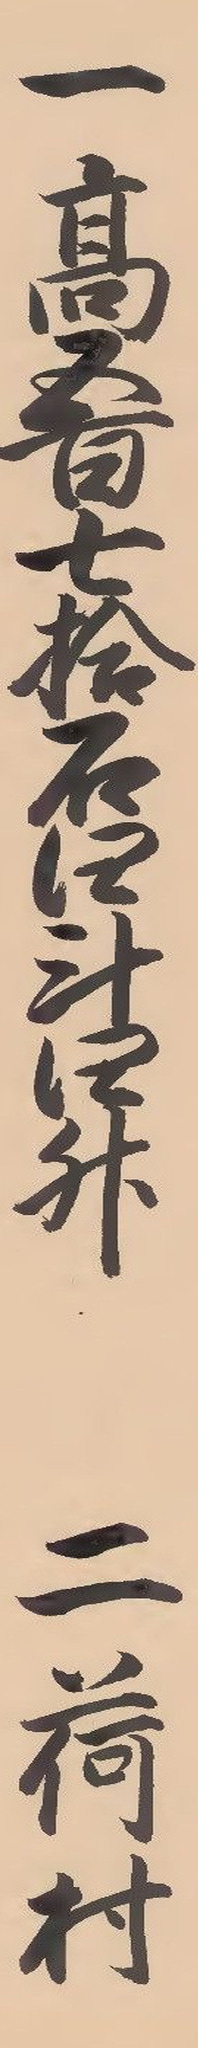一高五百七拾石四斗四升二荷村
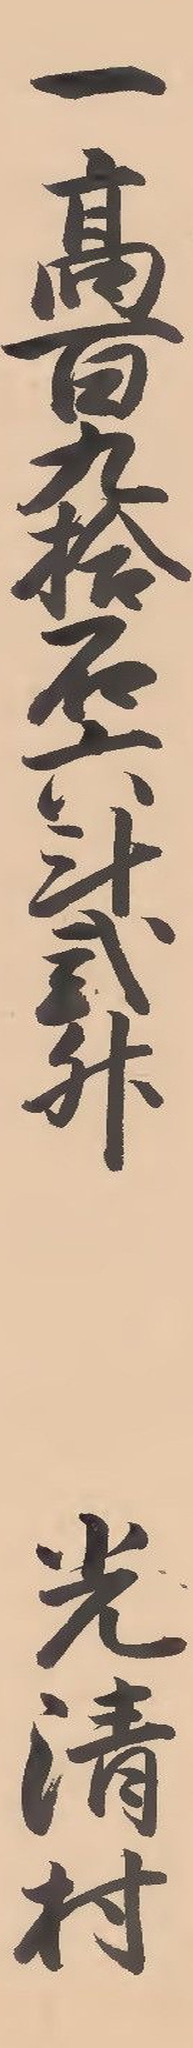一高百九拾石六斗弐升光清村

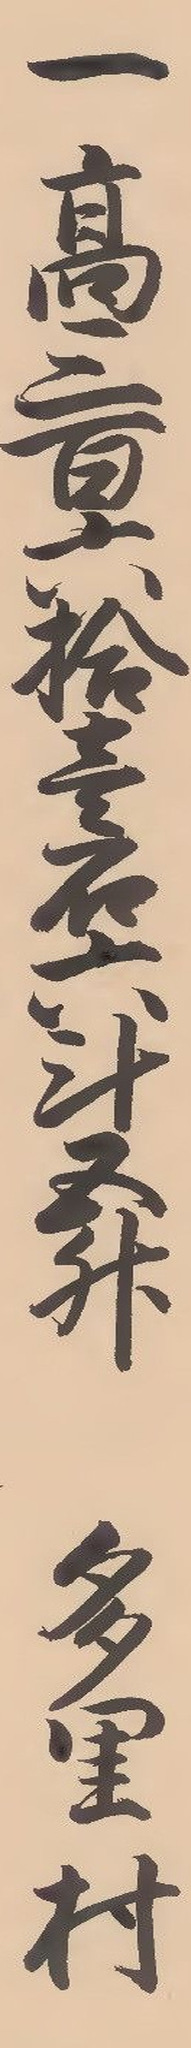一高三百六拾壱石六斗五升多里村
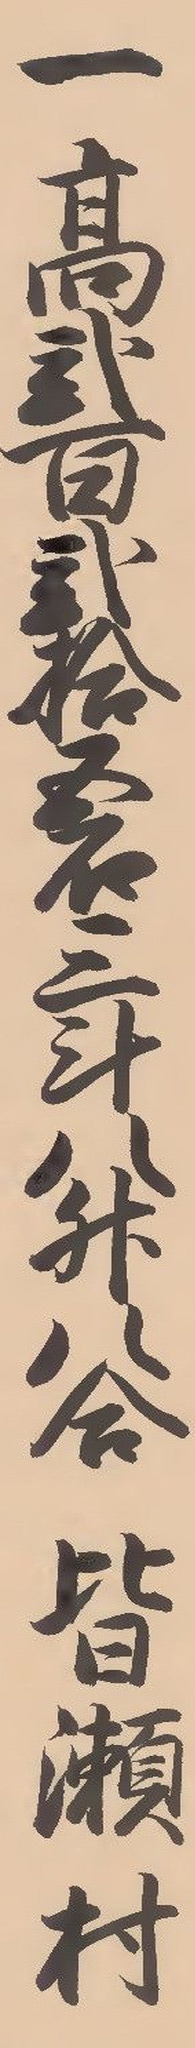一高弐百弐拾五石三斗八升八合皆瀬村
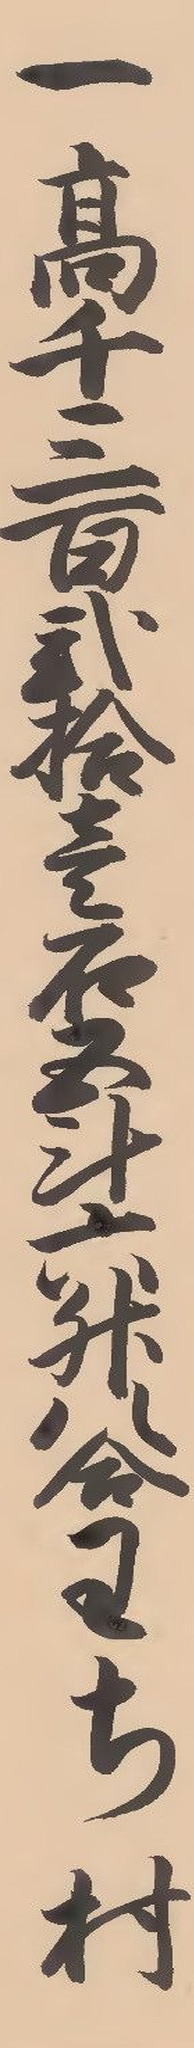一高千三百弐拾壱石五斗六升八合わち村
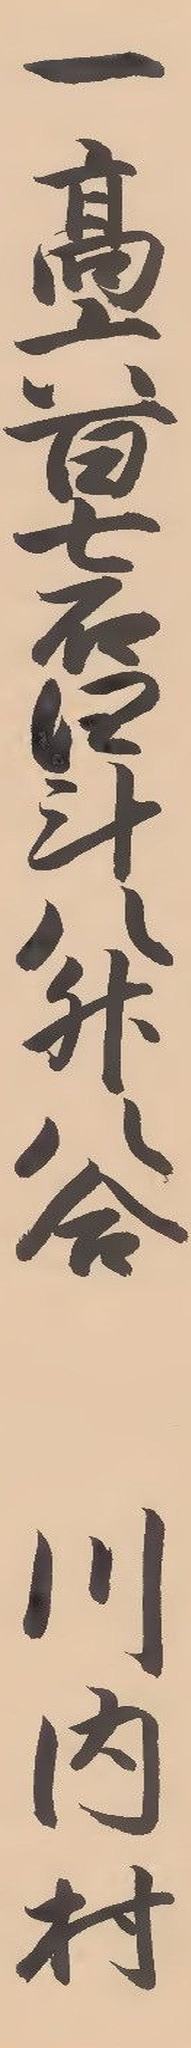一高六百七石四斗八升八合川内村
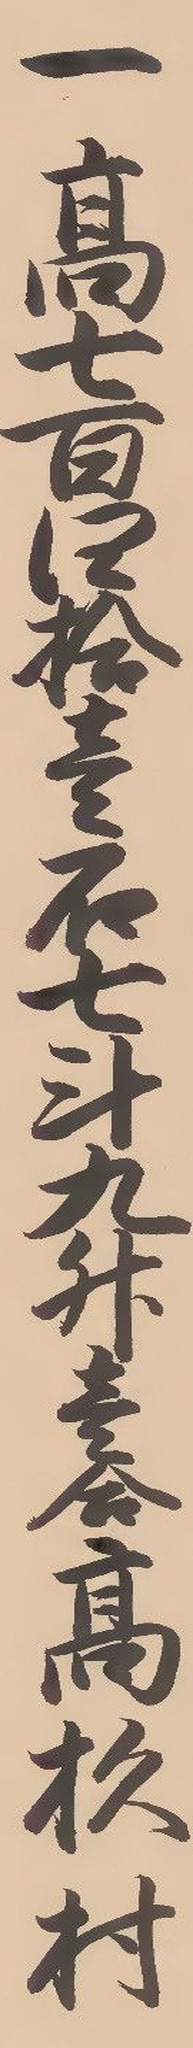一高七百四拾壱石七斗九升壱合高杉村
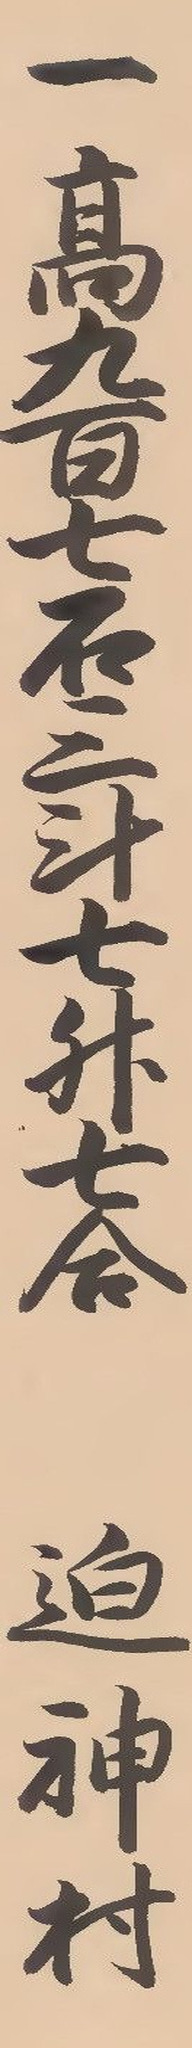一高九百七石三斗七升七合迫神村
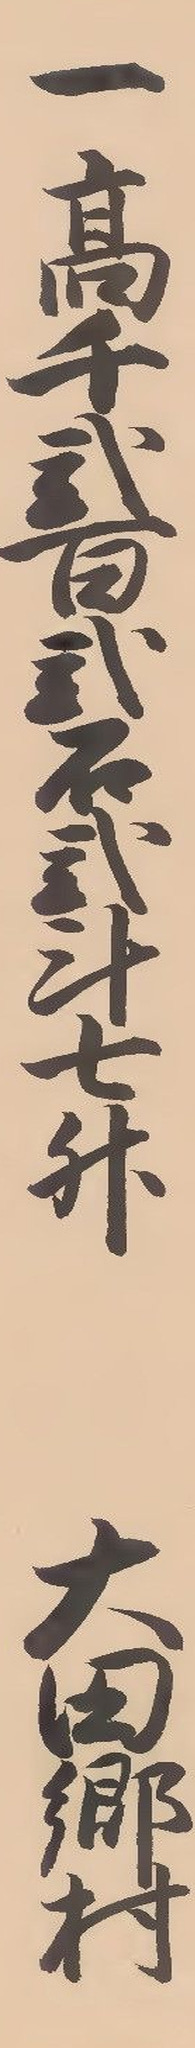一高千弐百弐石弐斗七升大田郷村
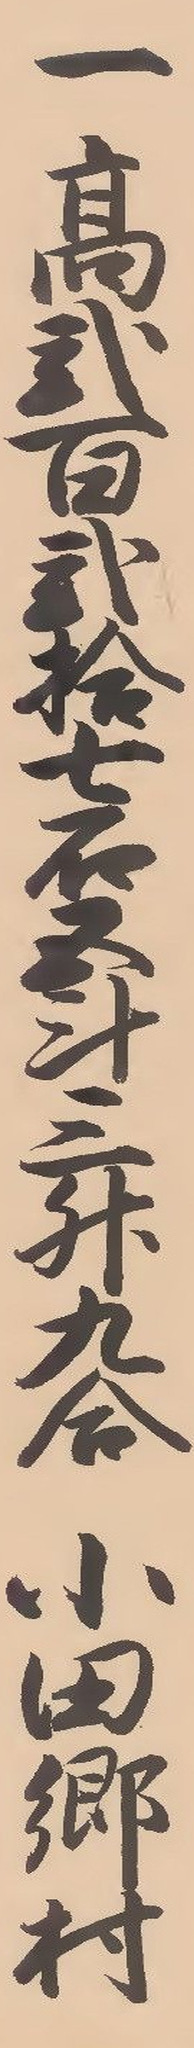一高弐百弐拾七石五斗三升九合小田郷村

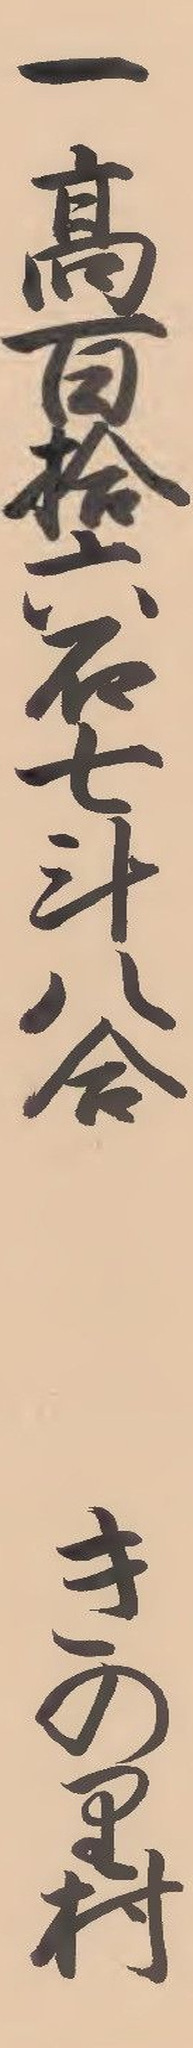一高百拾六石七斗八合きのり村
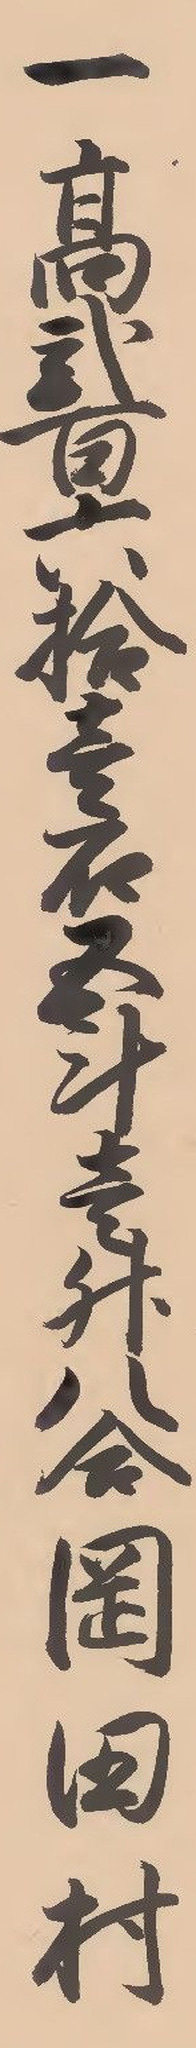一高弐百六拾壱石五斗壱升八合岡田村
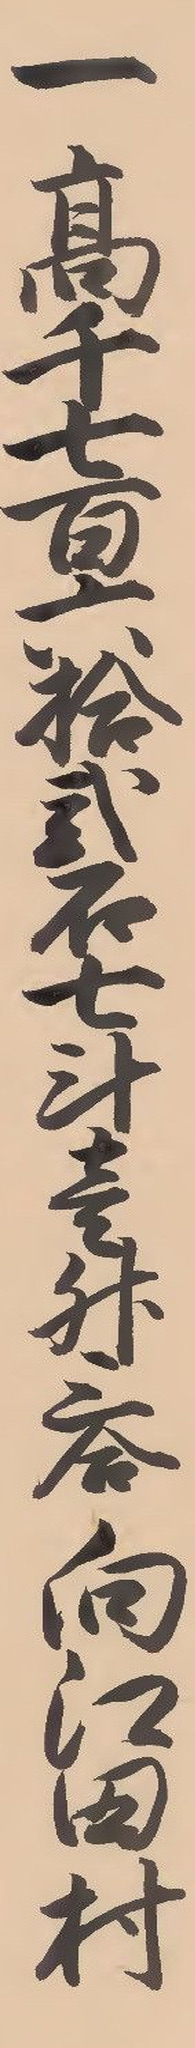一高千七百六拾弐石七斗壱升三合向江田村
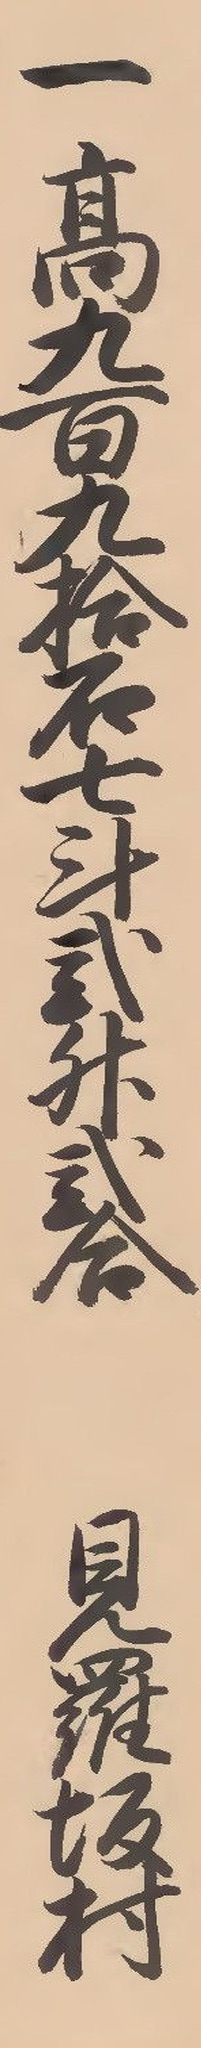一高九百九拾石七斗弐升弐合見羅坂村
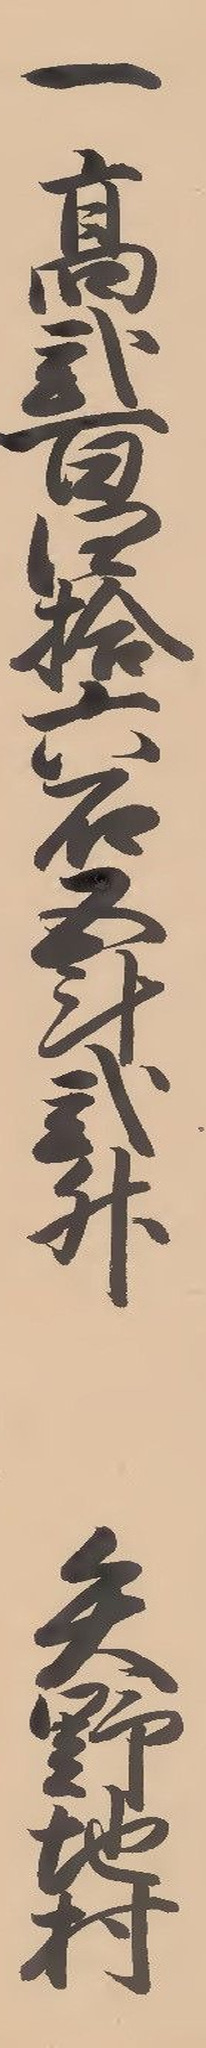一高弐百四拾六石五斗弐升矢野地村
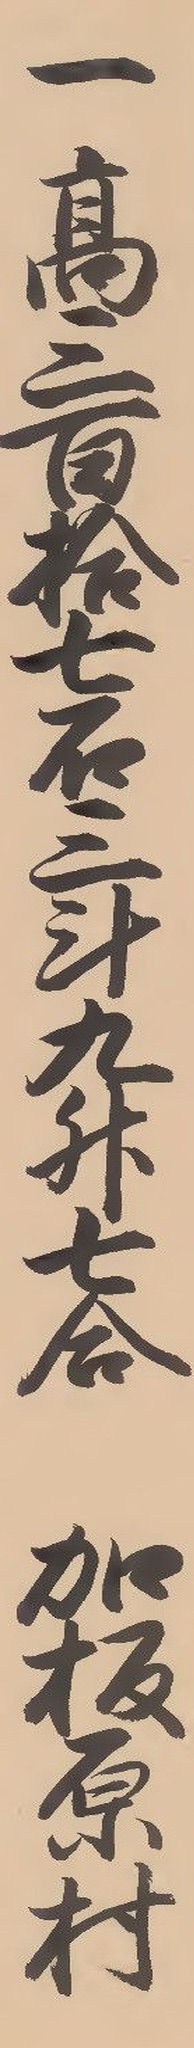一高三百拾七石三斗九升七合加板原村
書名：備後国郷帳
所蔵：国立公文書館 National Archives of Japan
